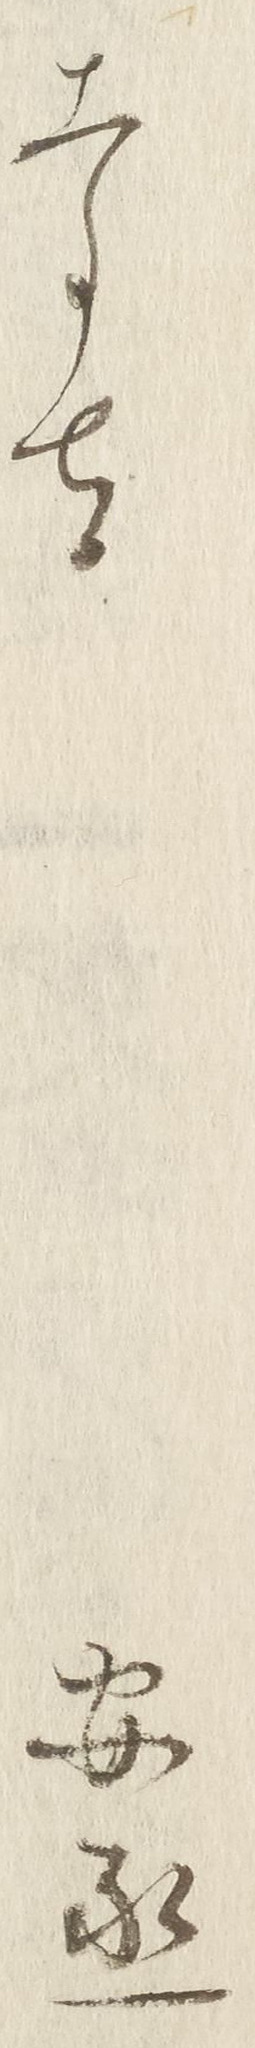十一月七日安丞
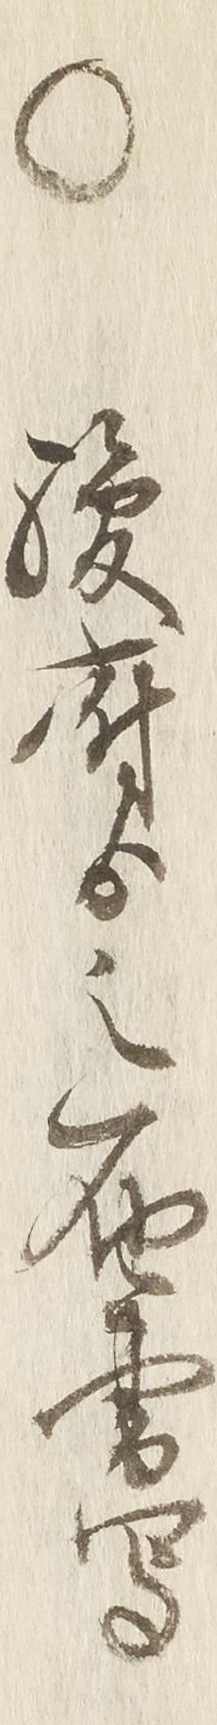◯駿府ゟ之届書写
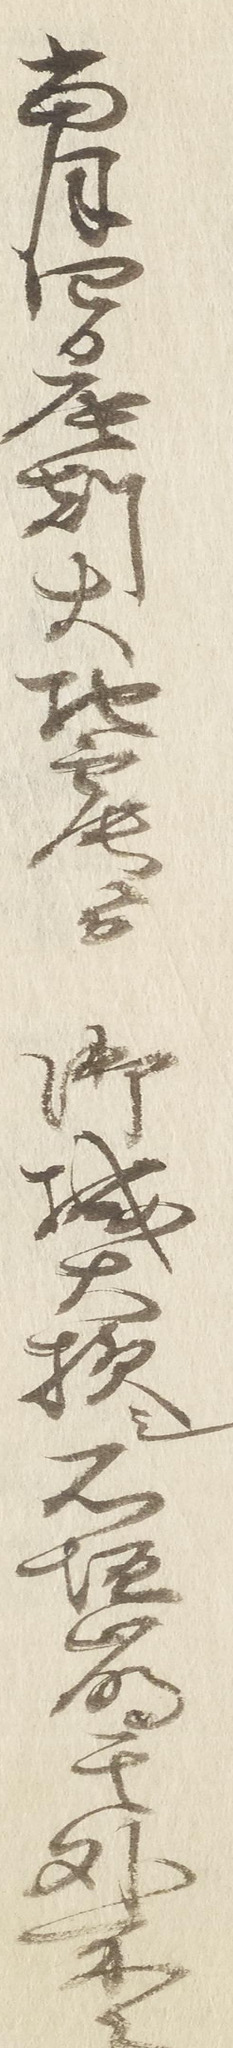当月四日辰刻大地震二而御城大損ㇱ石垣崩其外所々
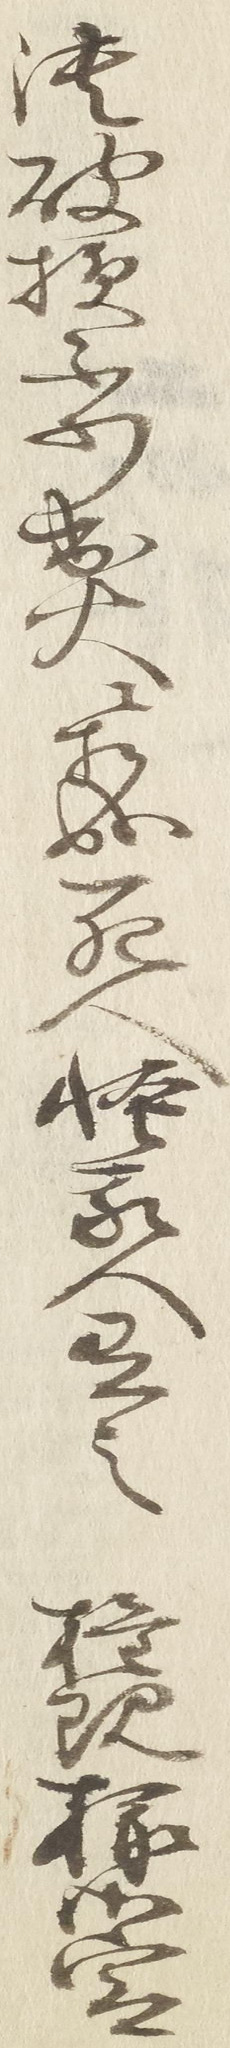潰破損不少出火二相成死人怪我人有之権現様御宮
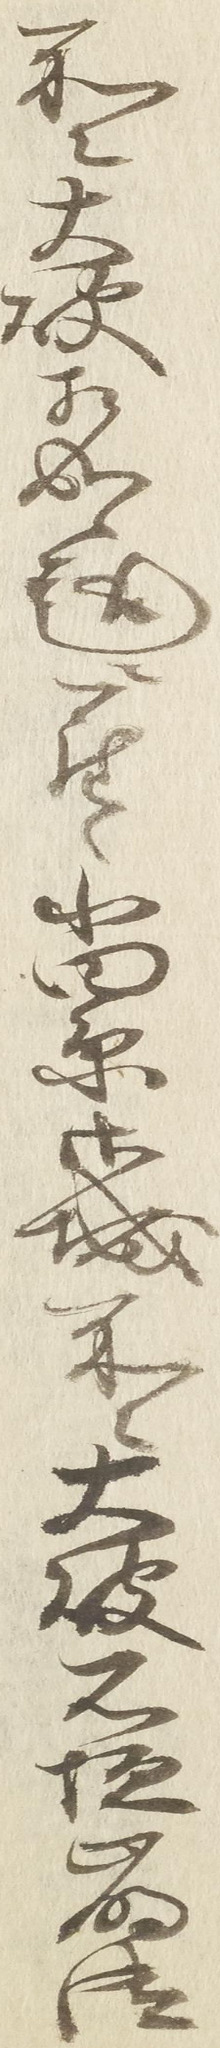所々大破相成趣二御座候小田原御城所々大破石垣崩御
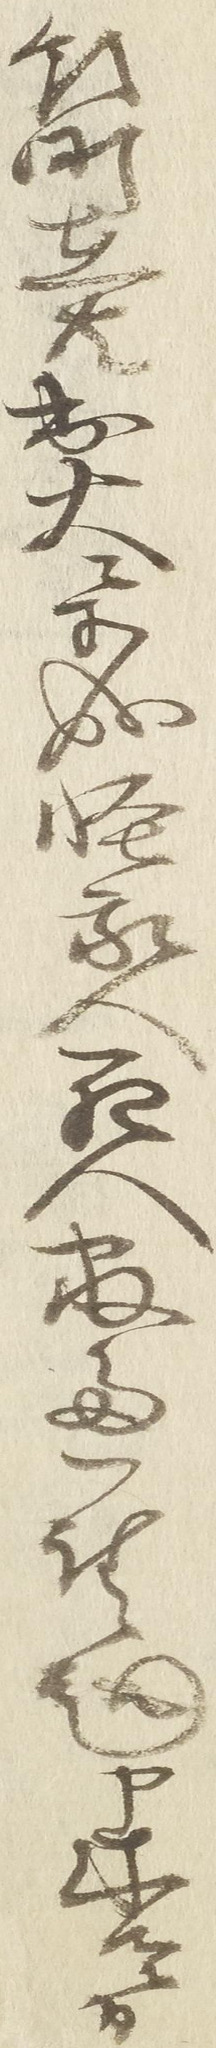領町在共出火二相成怪我人死人数多御座候趣申来たり候

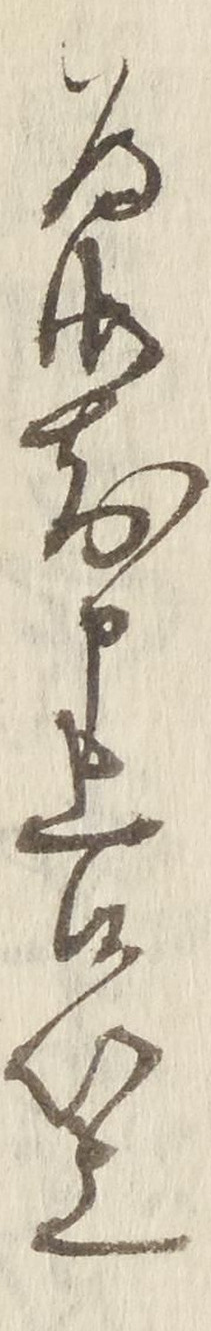為御知申上候以上」
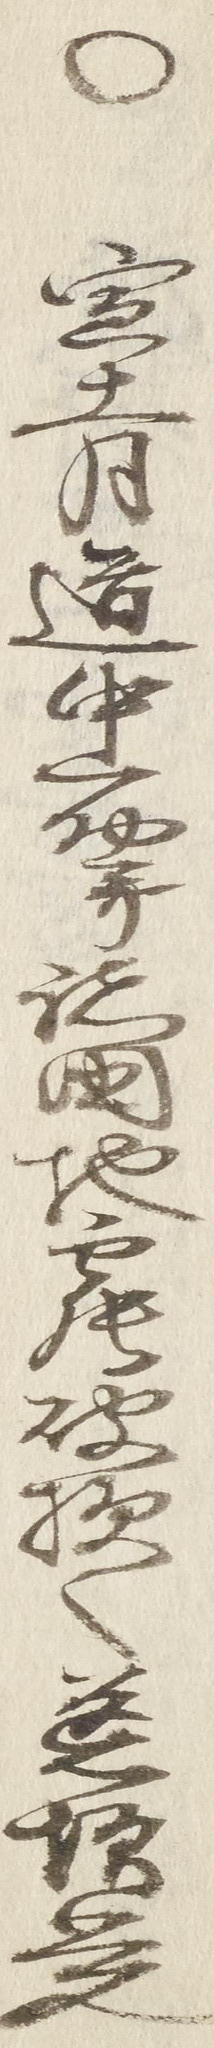◯寅十一月道中筋并諸国地震破損之荒増覚
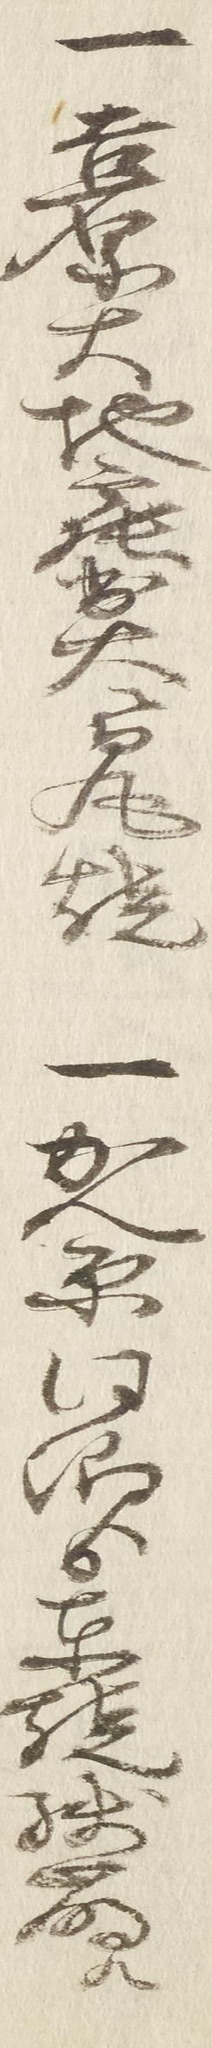一吉原大地震出火二而丸焼一かん原同泊ゟ東焼残崩ㇽ
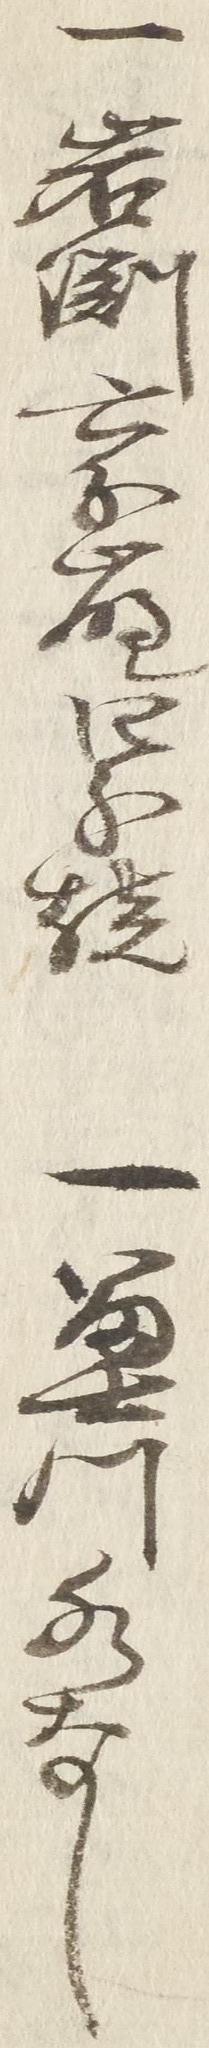一岩淵六分崩ㇾ四分焼一富士川水なし
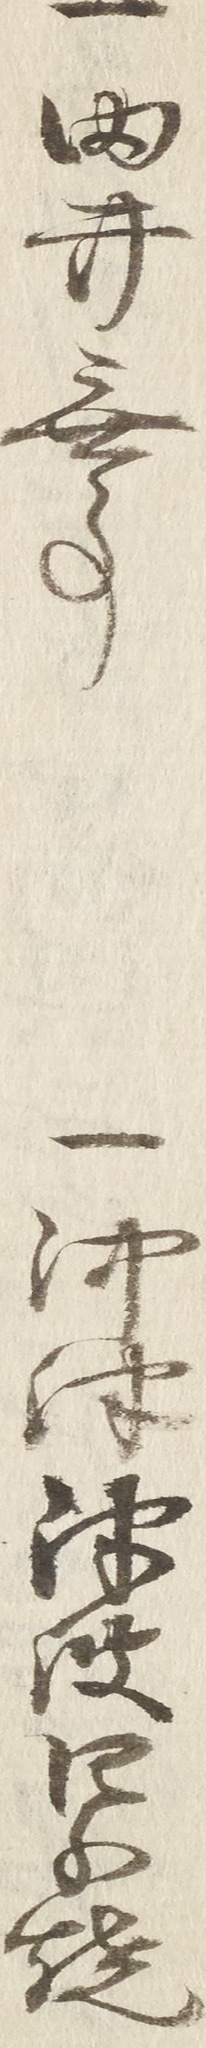一由井無事一沖津津波四分焼
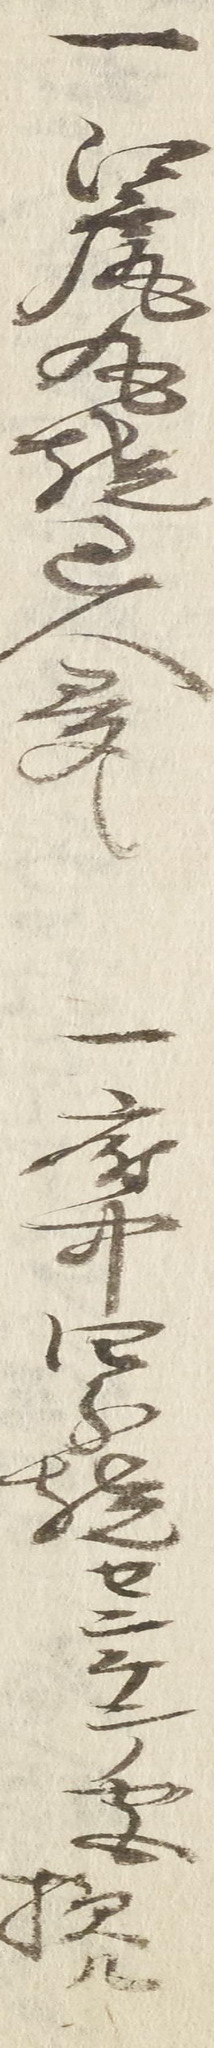一江尻丸焼過人多し一府中四分焼センケンノ宮損ㇽ
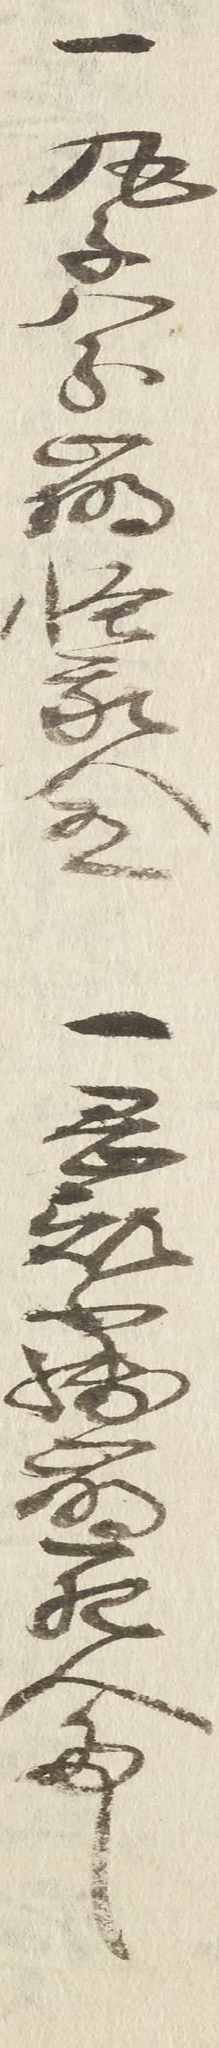一丸子八分崩怪我人有一岡部不残崩死人多し
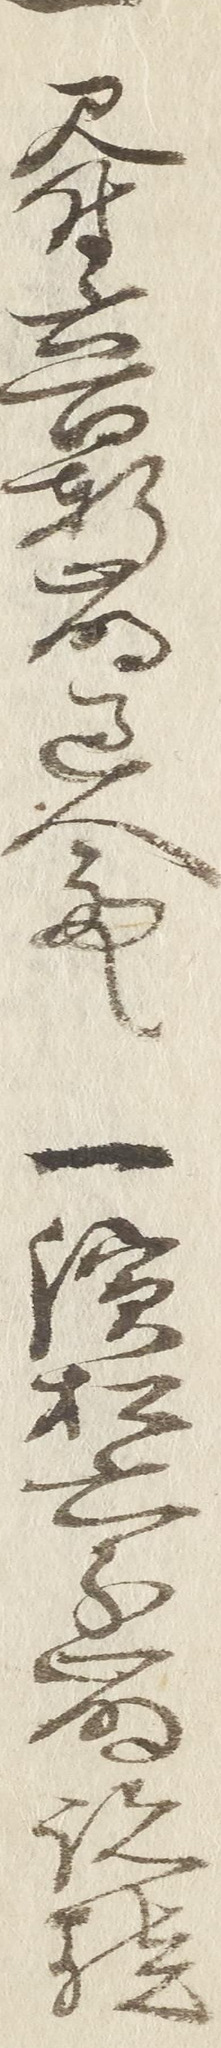一見付六百軒崩過人多し一浜松六分崩跡焼
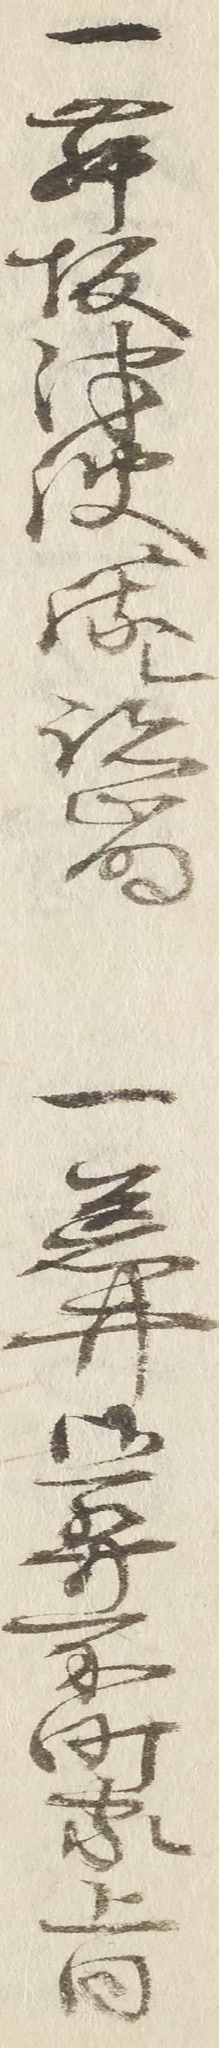一舞坂津波二流ㇾ跡崩一荒井御関所町家上同
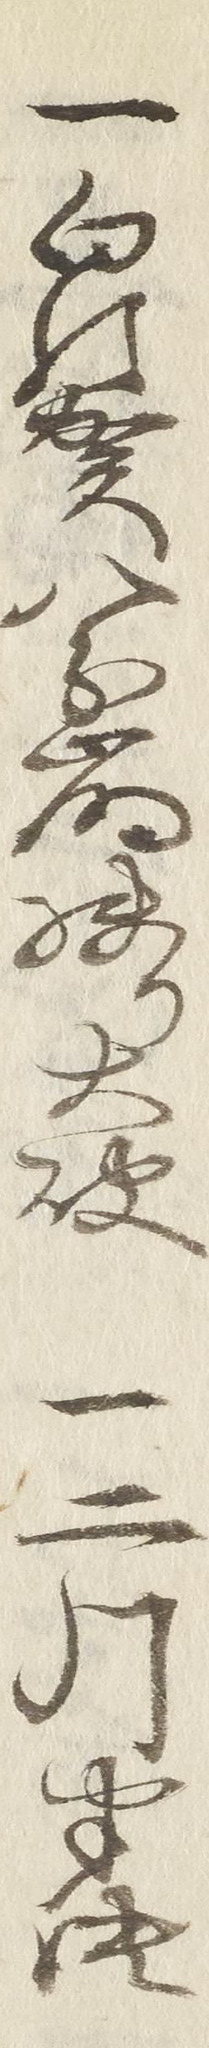一白須賀八分崩残り大破一二川半潰
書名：地震記　下
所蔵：東京大学地震研究所図書室 Earthquake Research Institute Library, The University of Tokyo, JAPAN
